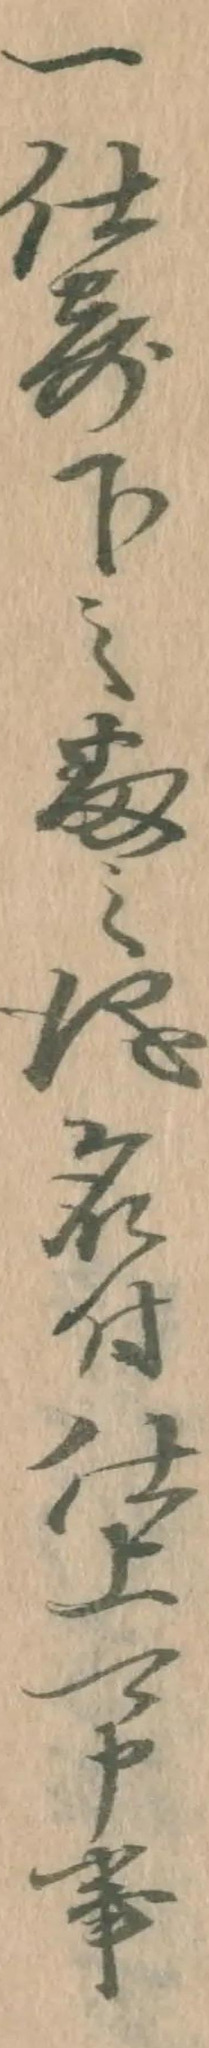一仕寄下之處之儀名付仕上可申事
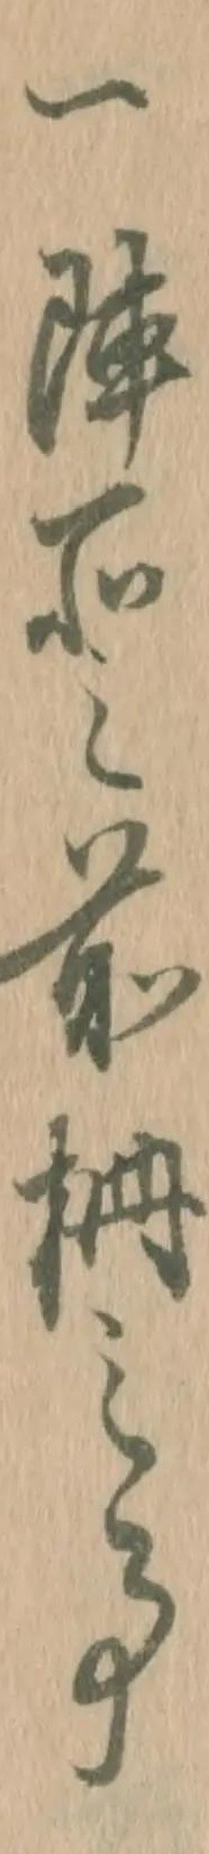一陣所之前柵之事
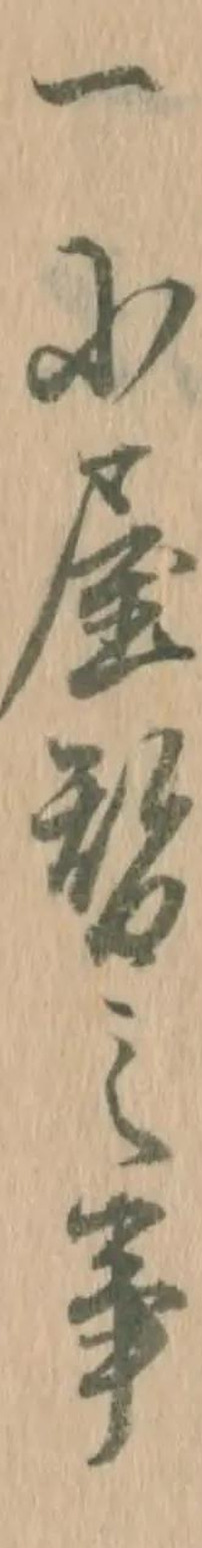一小屋替之事
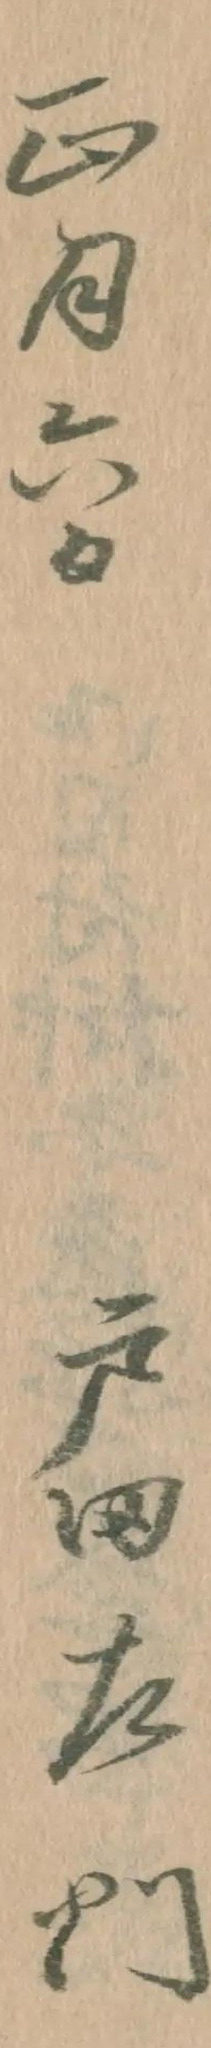正月六日戸田左門
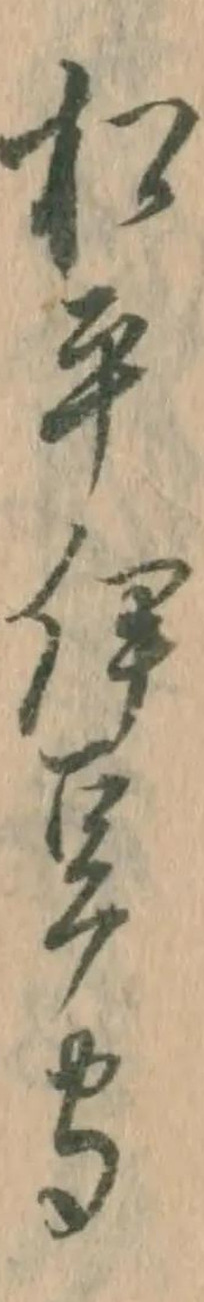松平伊豆守
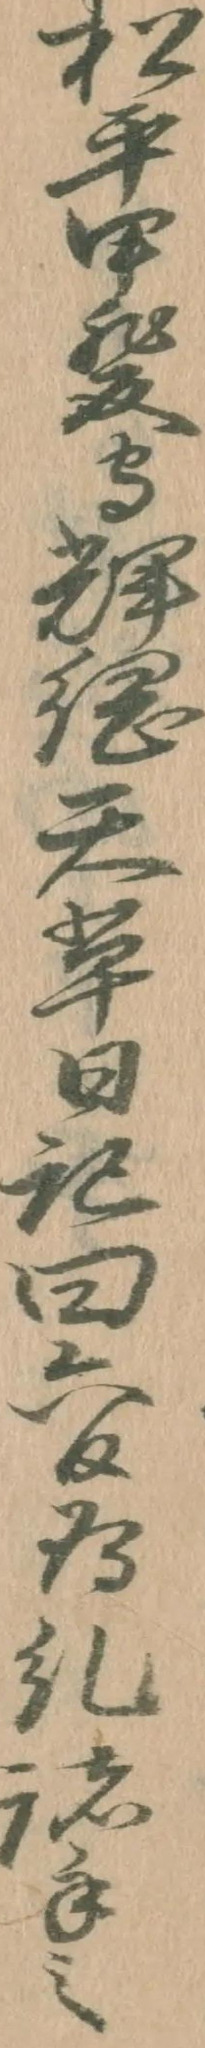松平甲斐守輝綱天草日記曰六日為糺諸手之
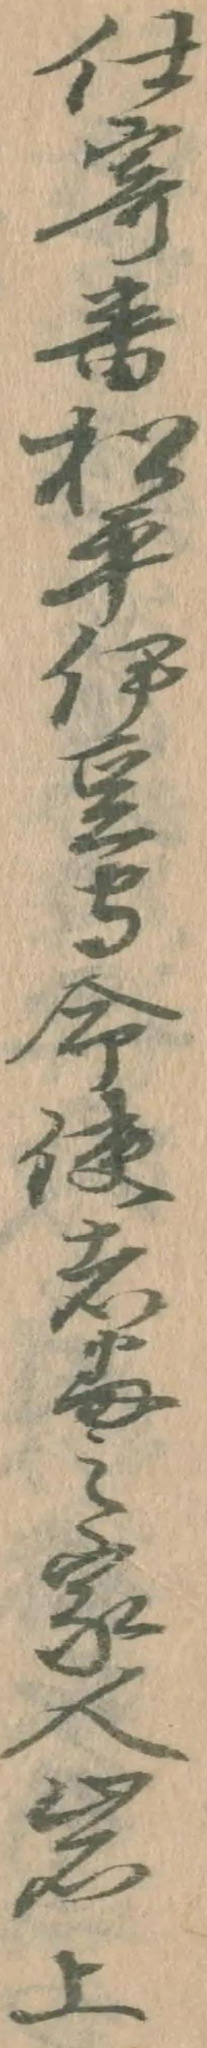仕寄番松平伊豆守命使者番之家人岩上
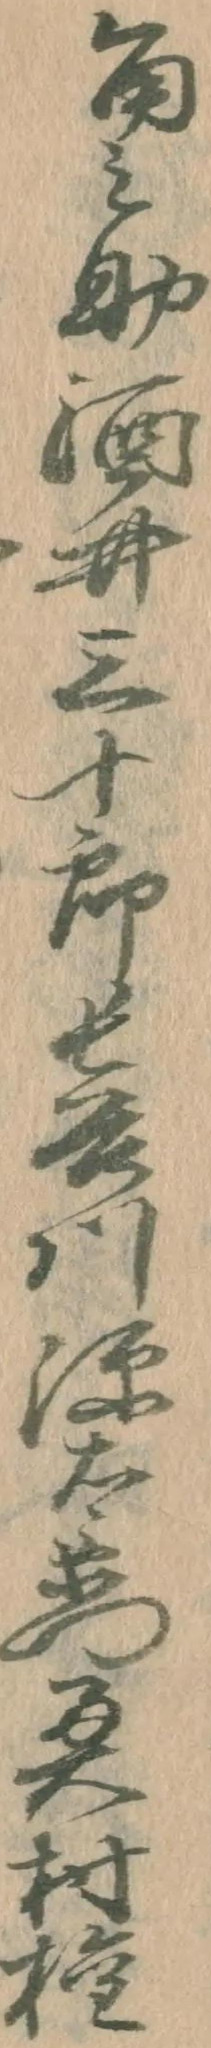角之助酒井三十郎長谷川源右衛門奥村権
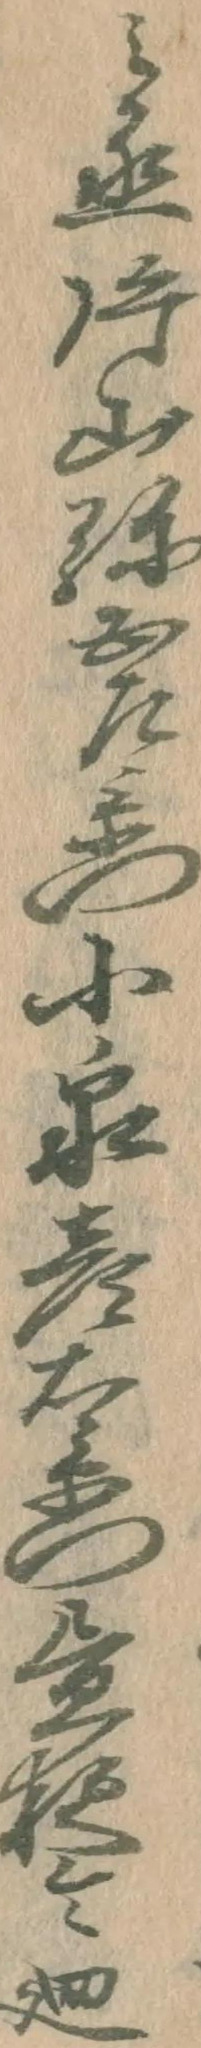之丞片山弥五左衛門小泉彦右衛門昼夜令廻
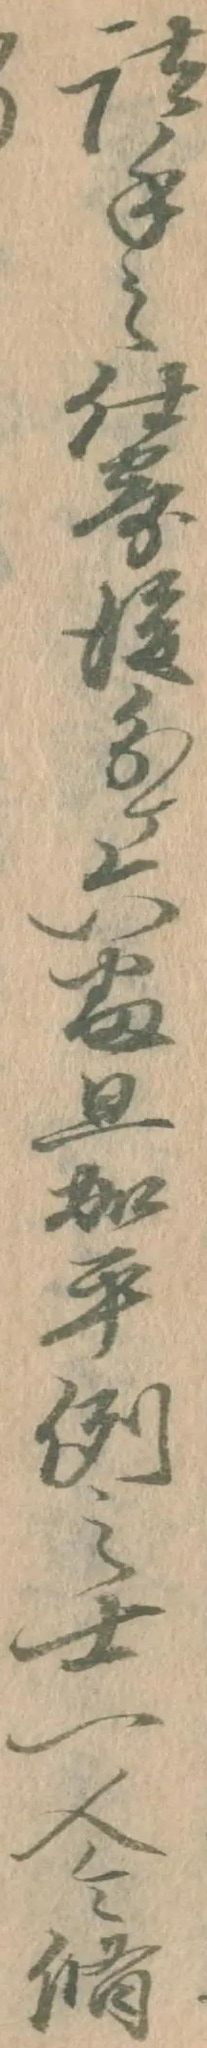諸手之仕寄後分け六番且加平例之士一人令修
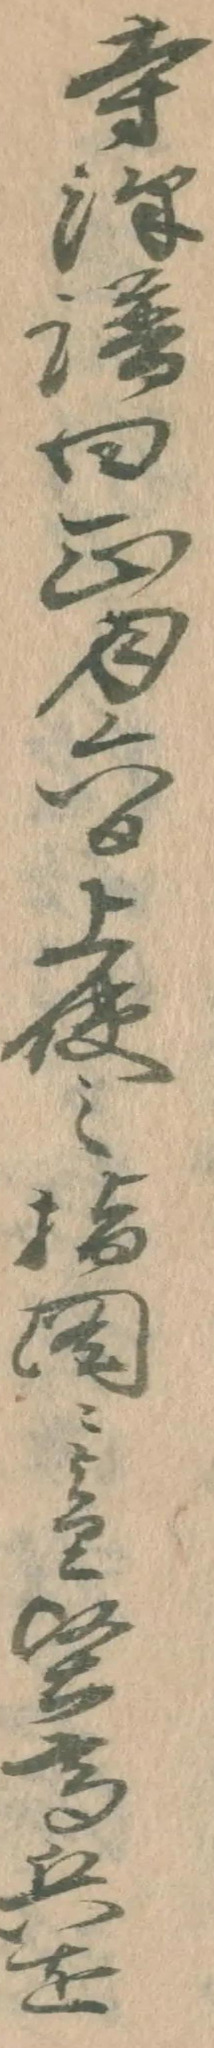寺沢譜曰正月六日上使之指図に与里堅高兵を
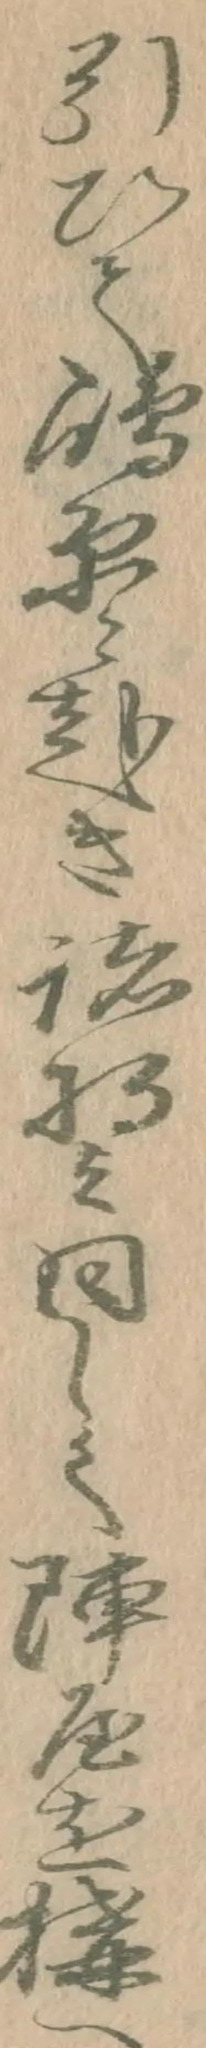引ひて島原に赴き諸将与同しく陣屋を構へ
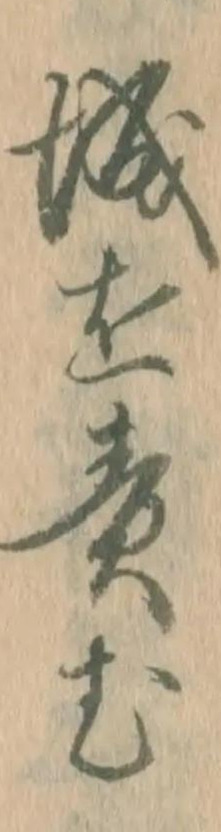城を責む

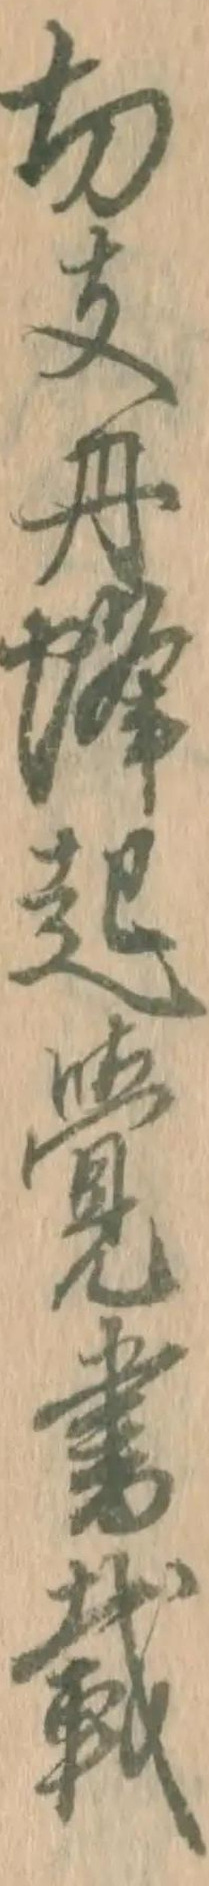切支丹蜂起覚書載
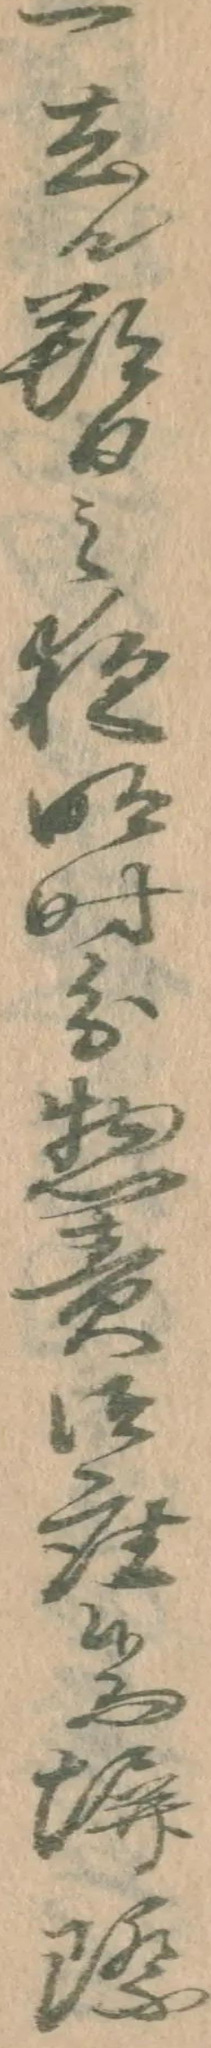一去る朔日之夜明時分惣責御座候而塀際
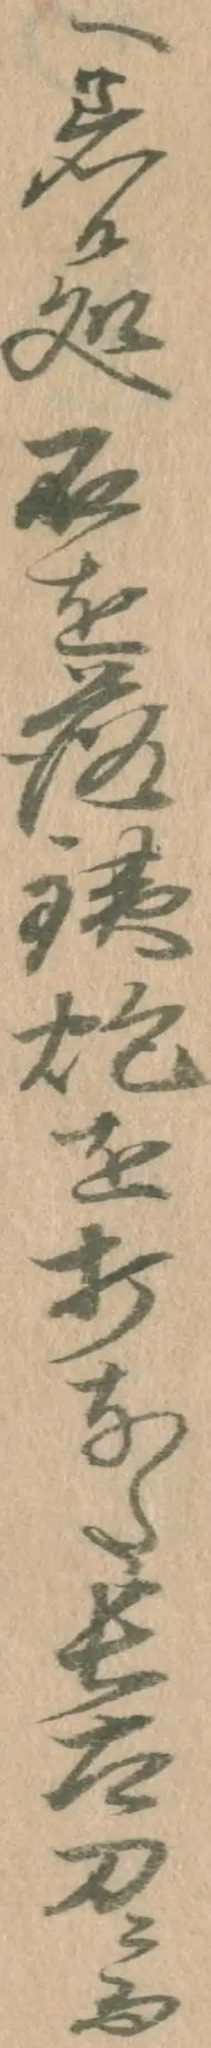へ着候処石を落鉄砲を打なた長太刀に而
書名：切支丹御退治記 49巻. [5]
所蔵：国立国会図書館 National Diet Library, JAPAN
